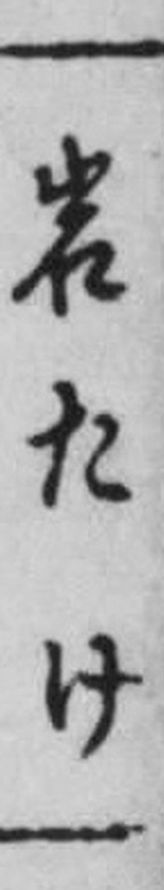岩たけ
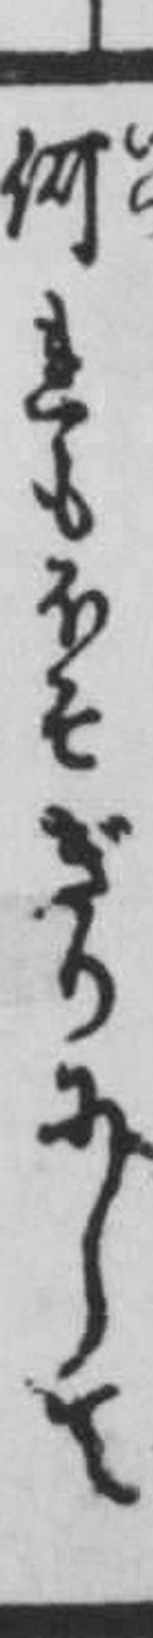何れもほそぎりにして
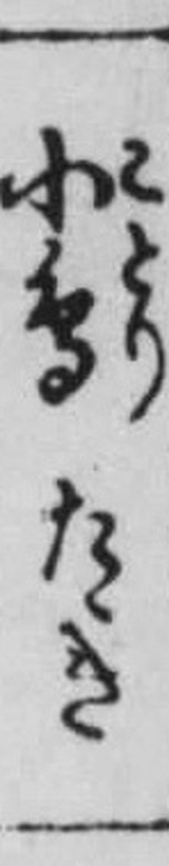小鳥たゝき
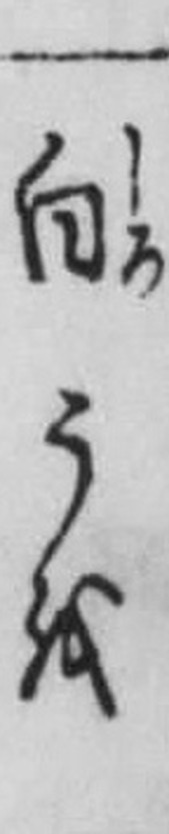白うを
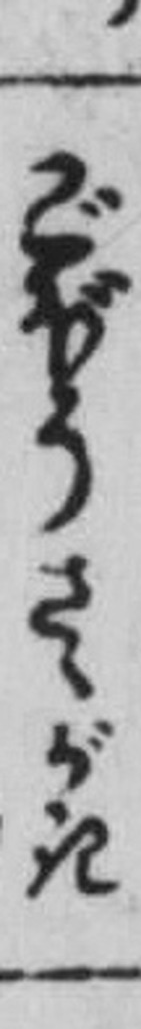ごぼうさゝがき
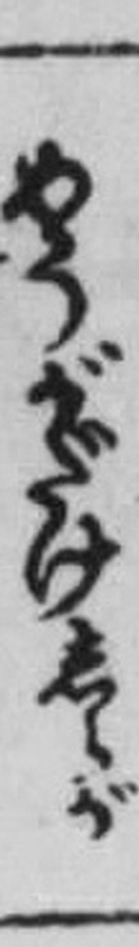めうがだけしらが
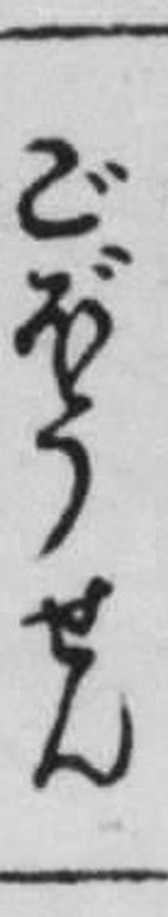ごぼうせん
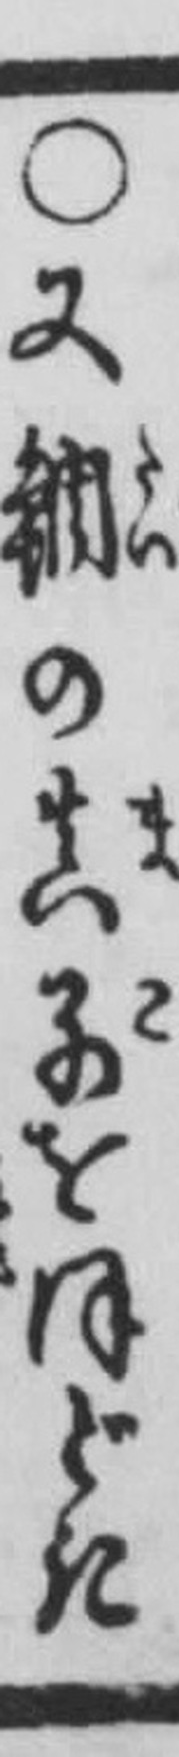〇又鯛の真子をほどき
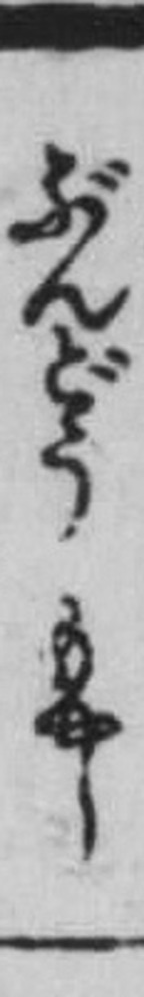ぶんどうもやし
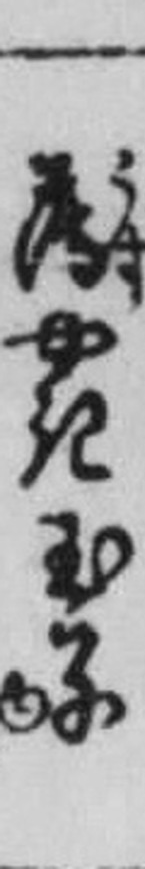薄やき玉子
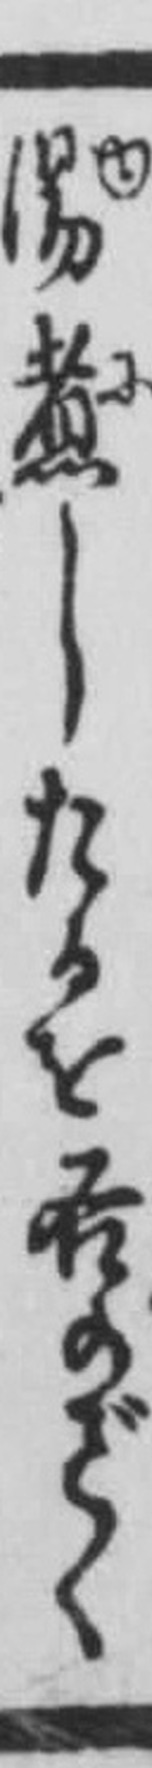湯煮したるを右のごとく
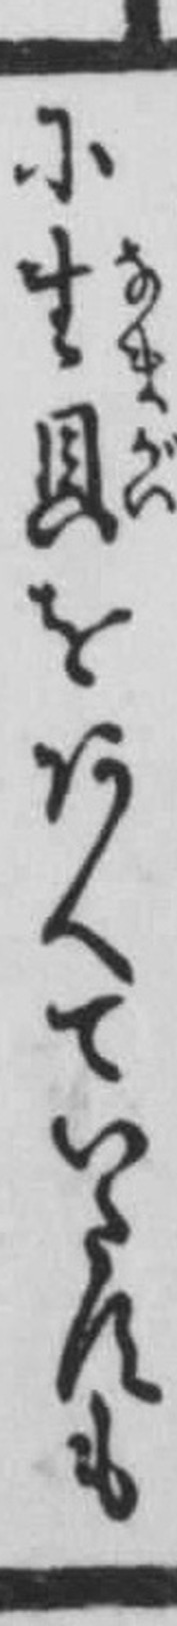に生貝をあへていたすも
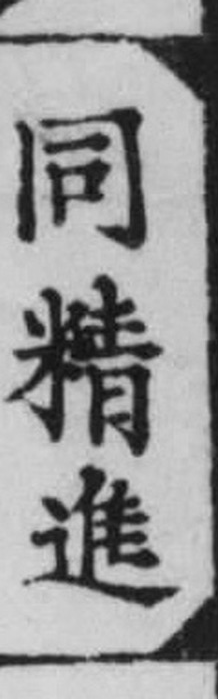同精進
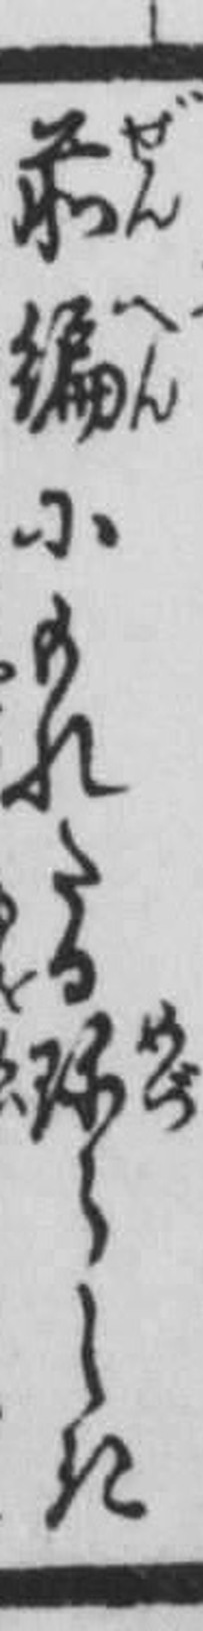前編にもれたる珍らしき
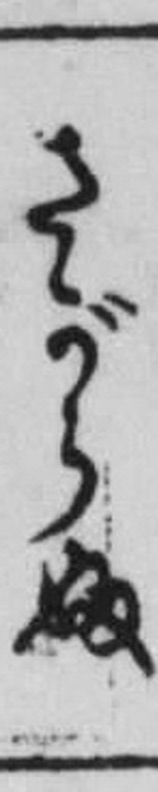さがらふ
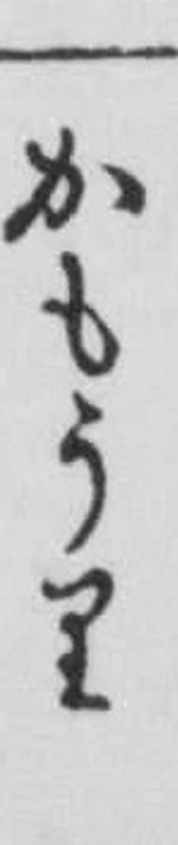かもうり
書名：日用重宝魚類精進/料理早工風
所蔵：大阪府立大学学術情報センター 国文学研究資料館
